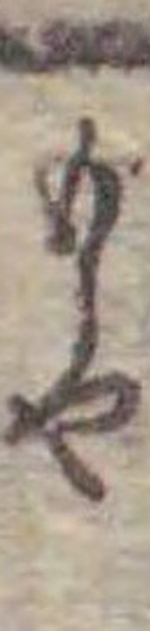もしや
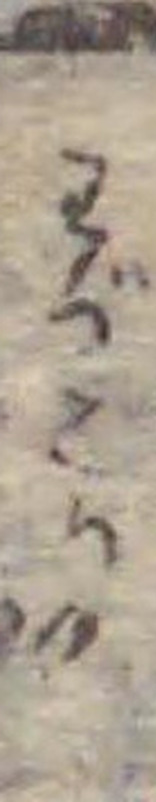わがこか
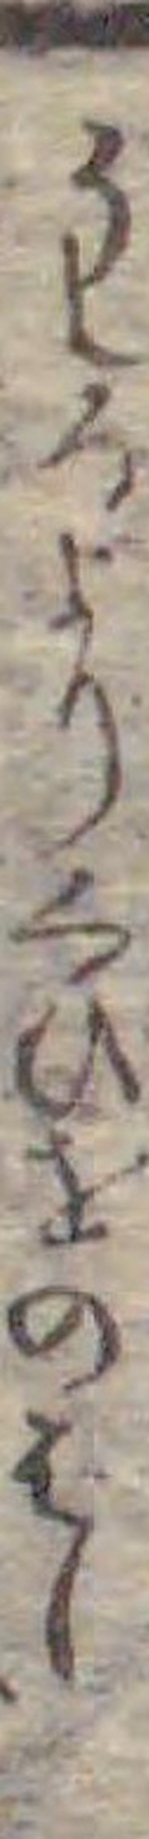うしろよりくびをのばし
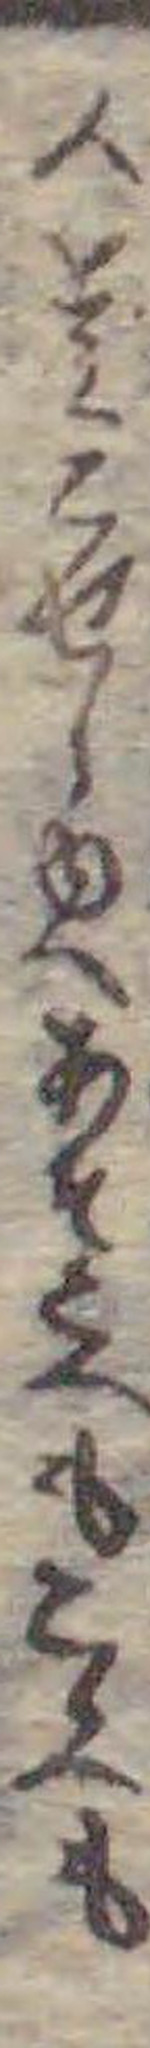人をみこせしゆへあそこへもこゝへも
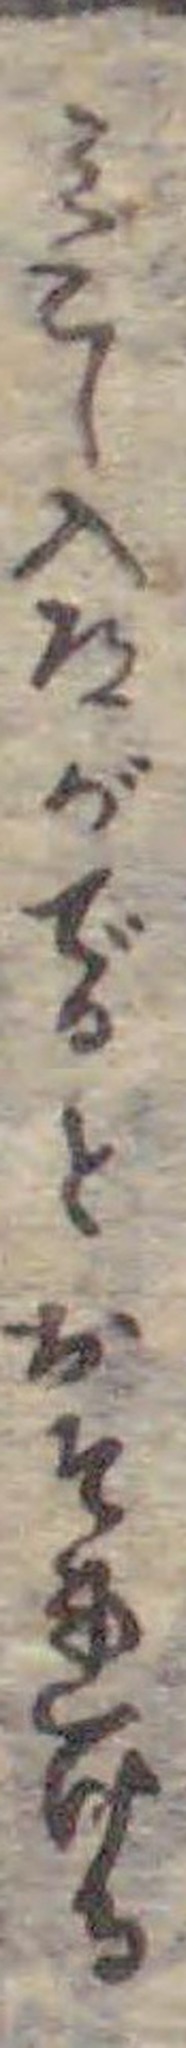見こし入道がでるとおそれける

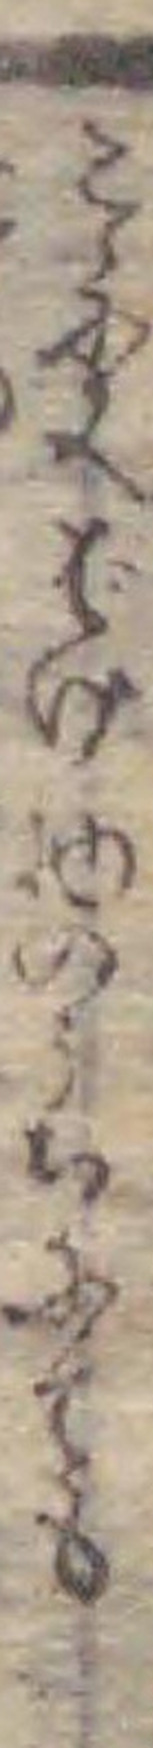こゝに又ばけ物のうちにても
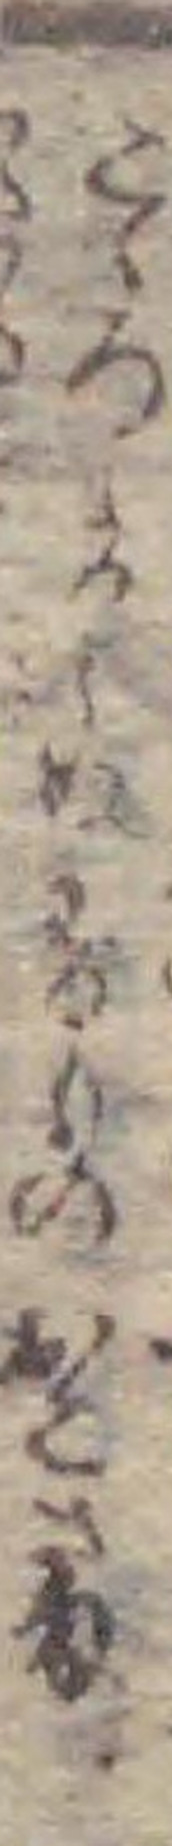こゝろよからぬわるものおこさま
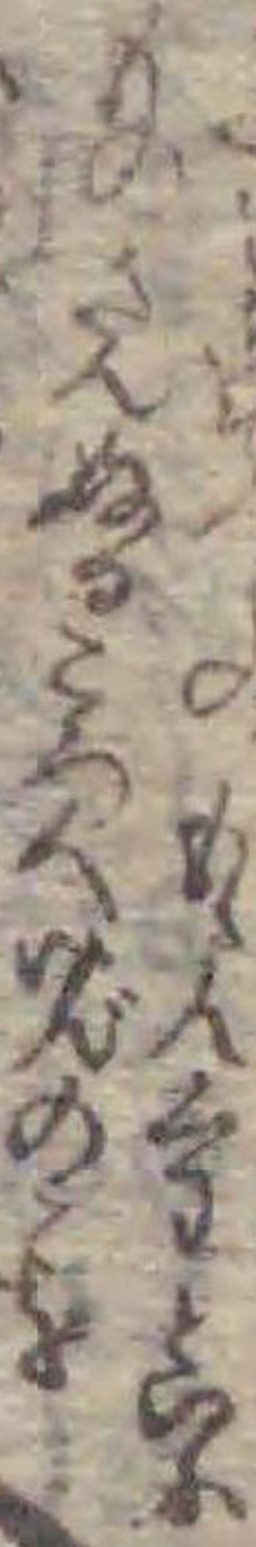ものさんぬるころ人げんのこを
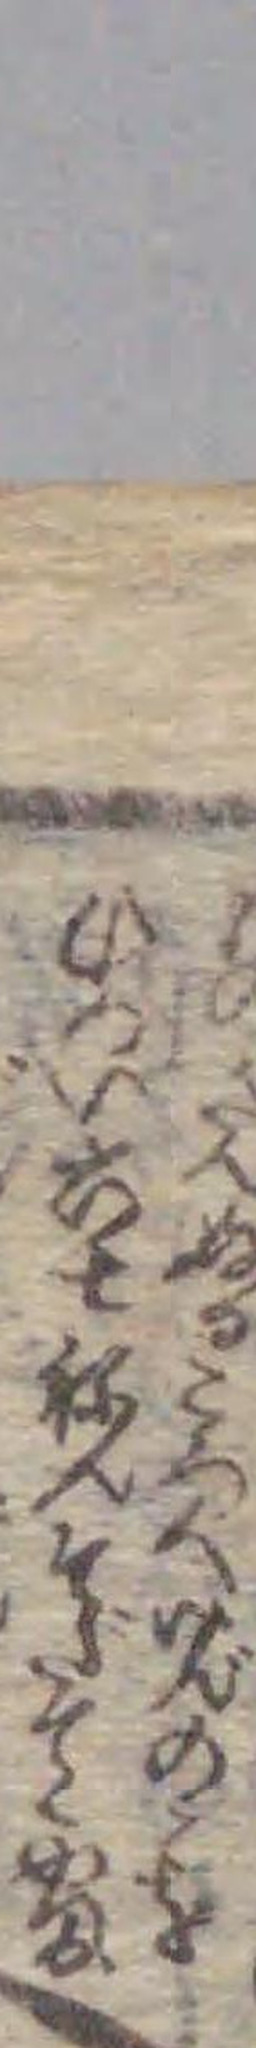ひろい六七ねんそだてゝやま
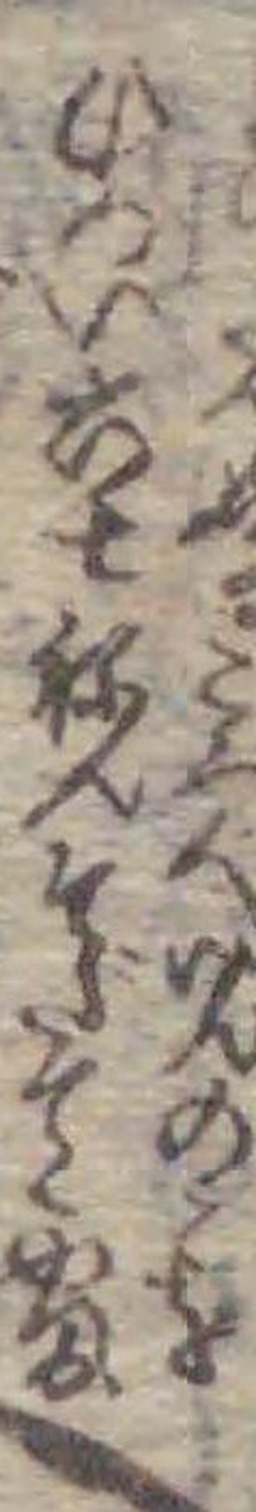ひろい六七ねんそだてゝやま
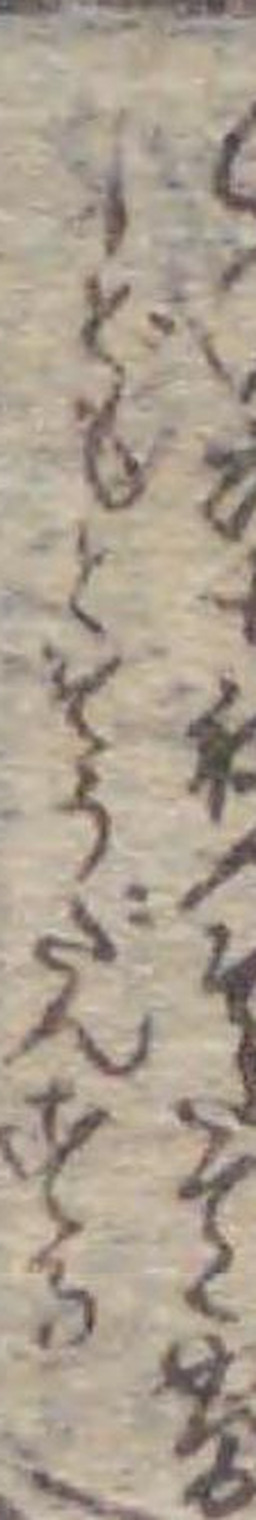しどもとそうだんする
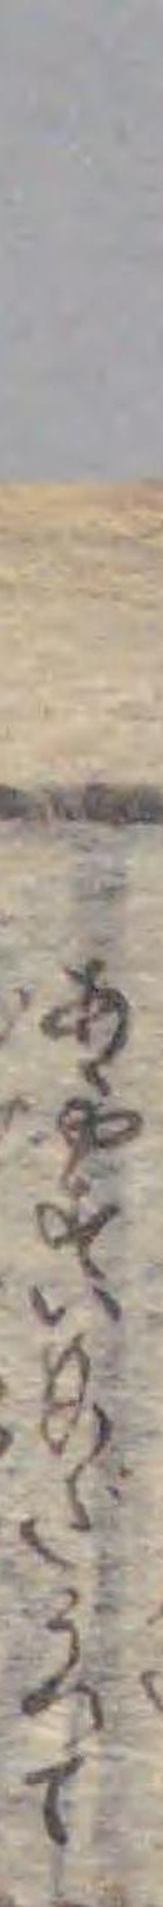あゝやすいものだかつて
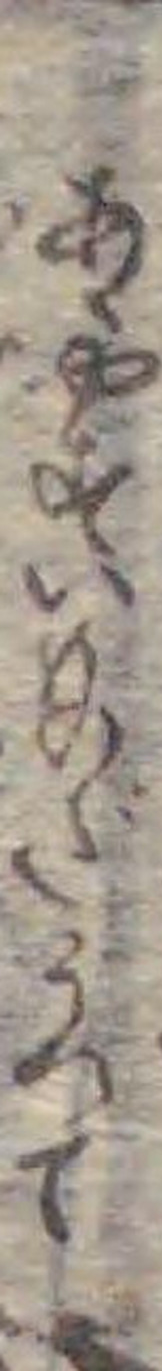あゝやすいものだかつて
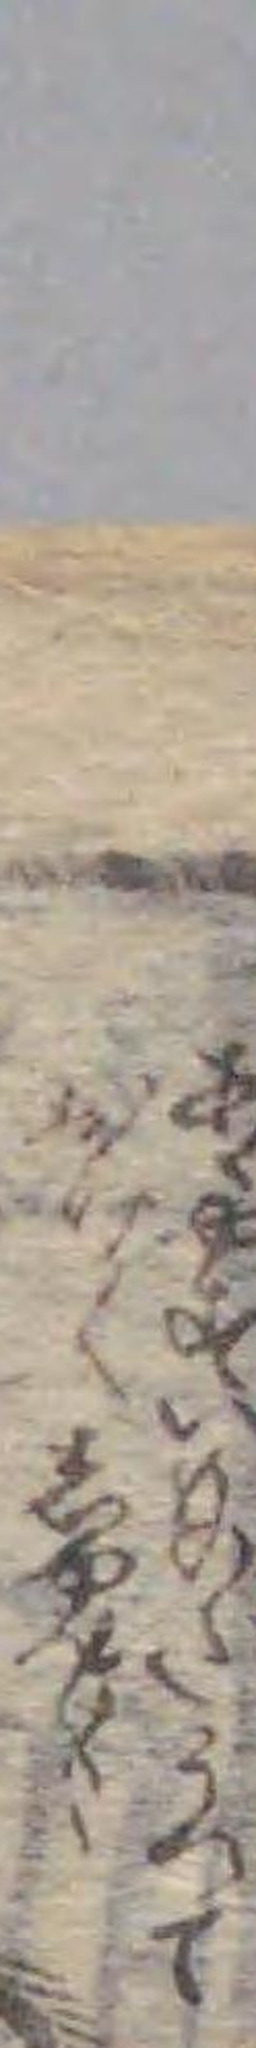おけ〳〵しやん〳〵〳〵
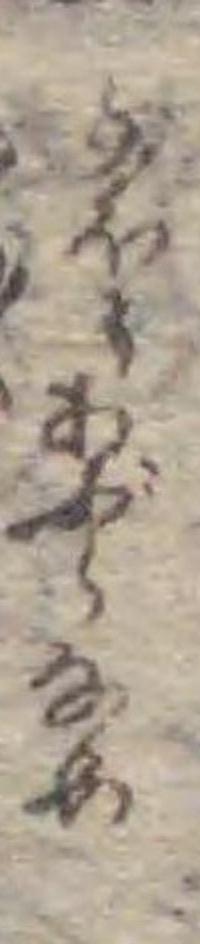かほあぶらなめ
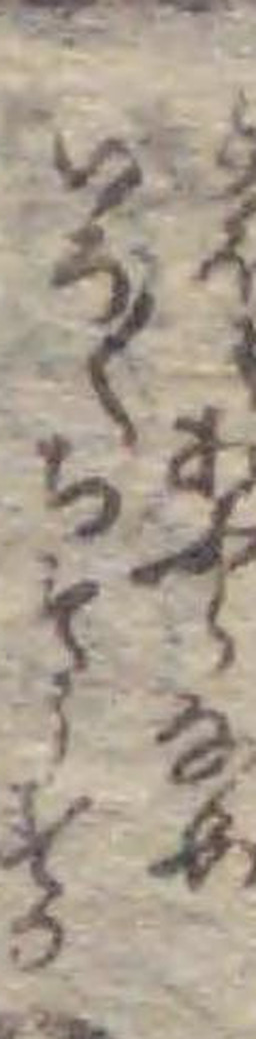いろ〳〵ちそうする
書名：[化物一代記] : 5巻
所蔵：国立国会図書館 National Diet Library, JAPAN
